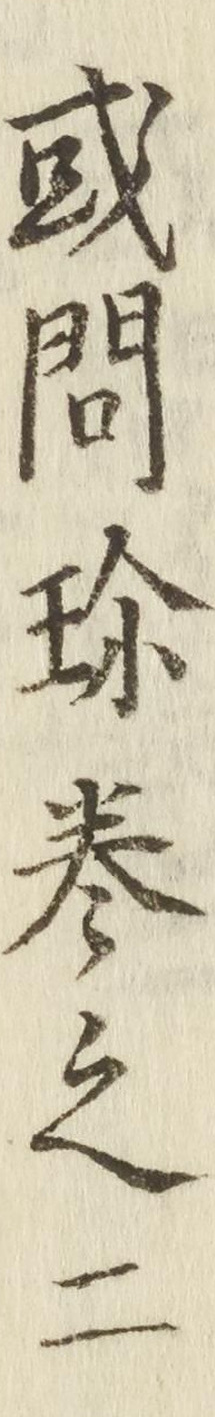或問珍巻之二
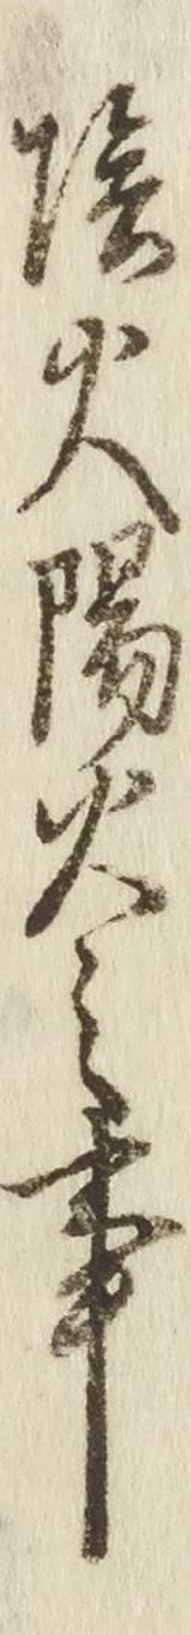陰火陽火之事
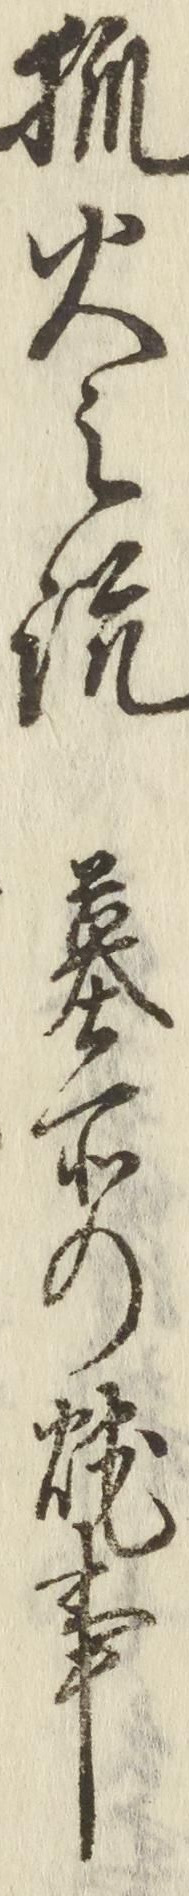狐火之説墓所の焼事
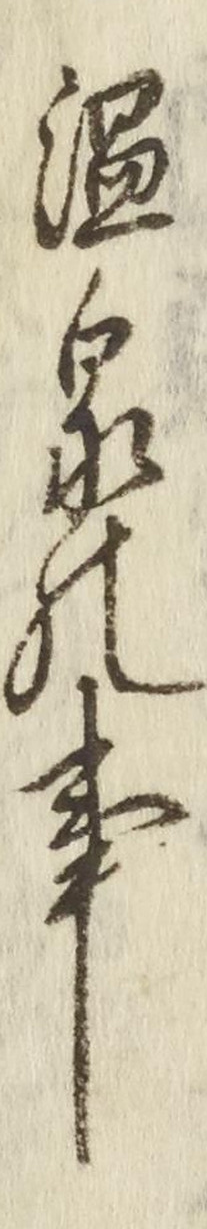温泉の事
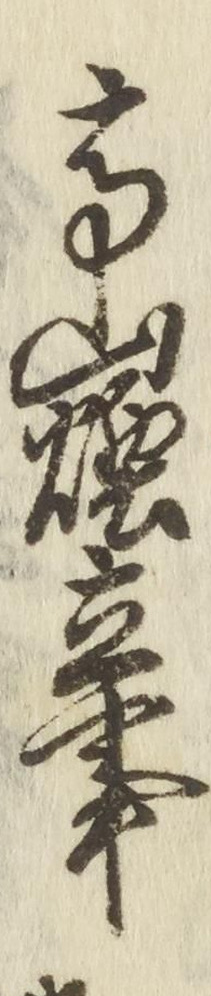高山煙立事
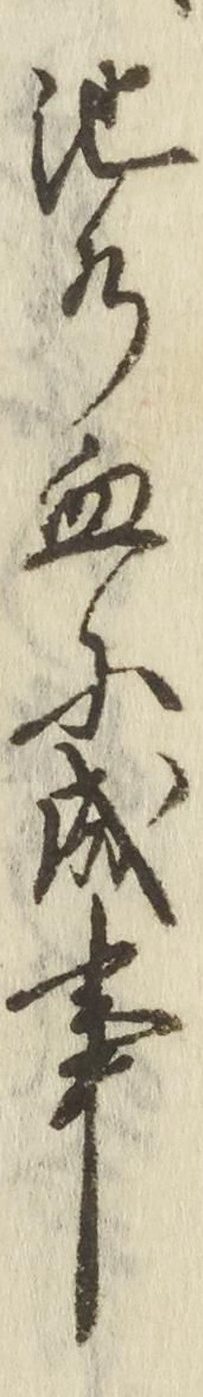池水血に成事

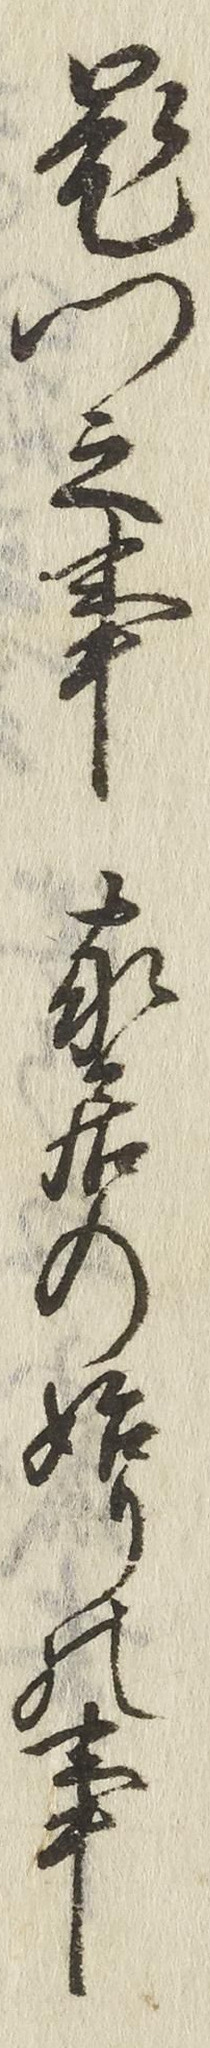鬼門之事家居の始りの事
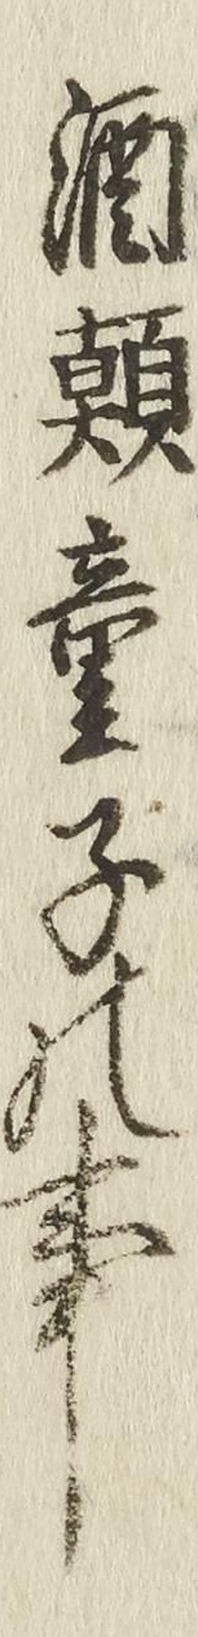酒顛童子の事
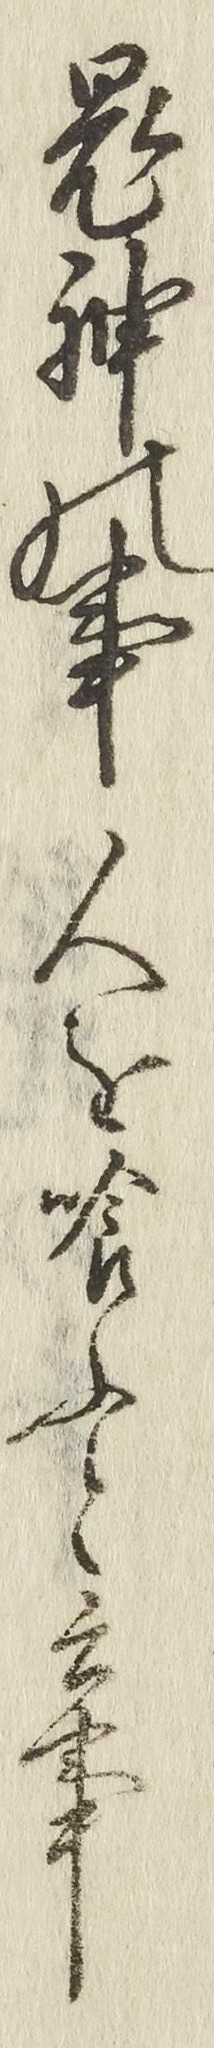鬼神の事人を喰ふと云事
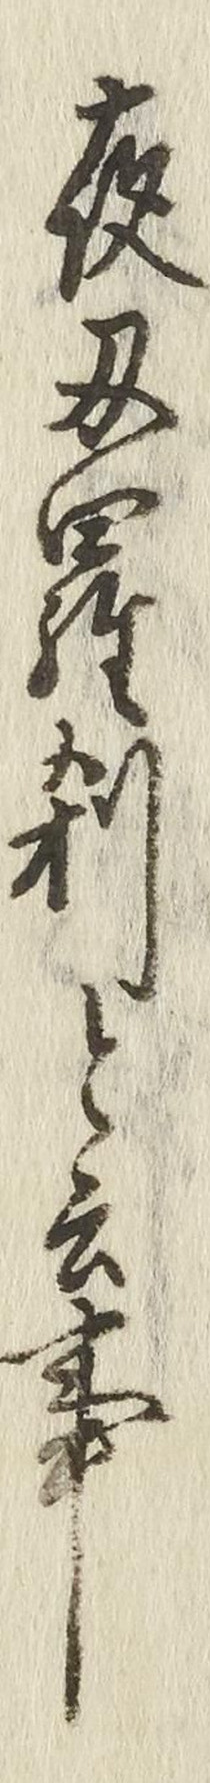夜刃羅刹と云事
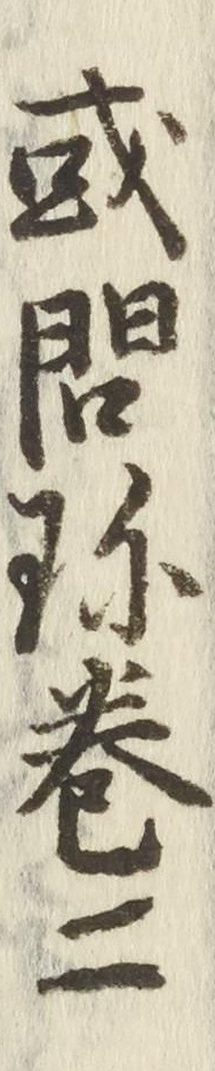或問珍巻二
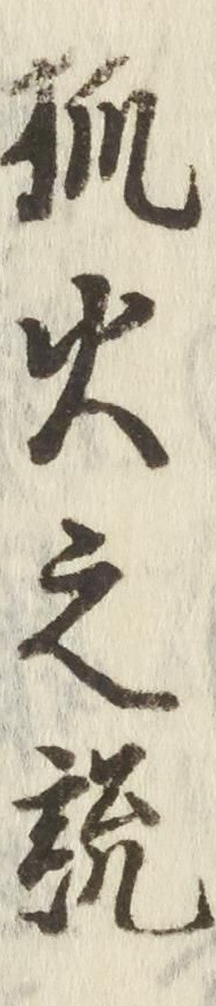狐火之説
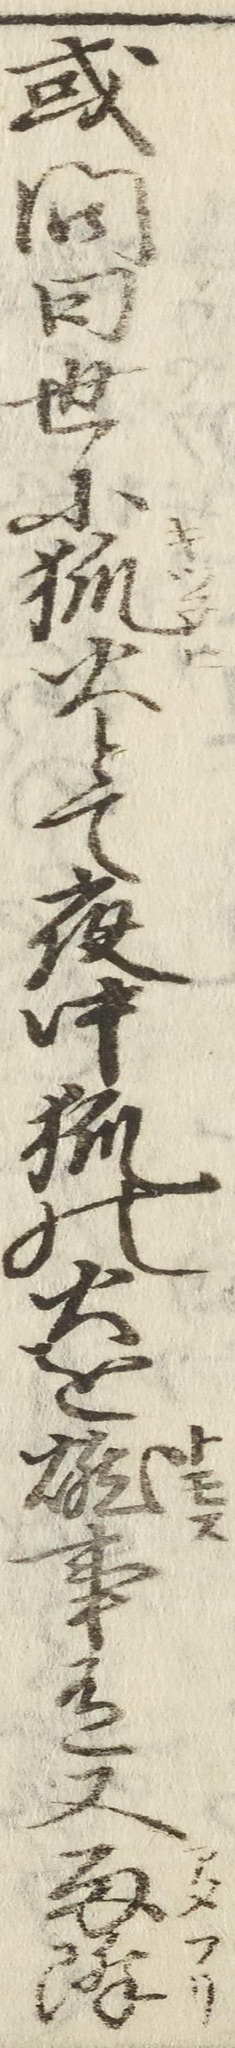或問曰世に狐火とて夜中狐の火を燃事有又雨降
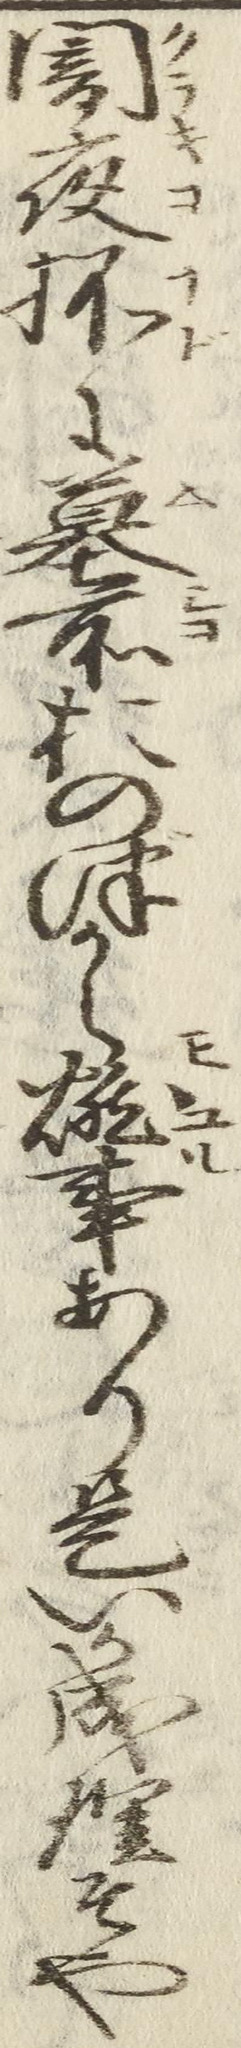闇夜抔に墓所おのづから燃事あり是いか成理そや
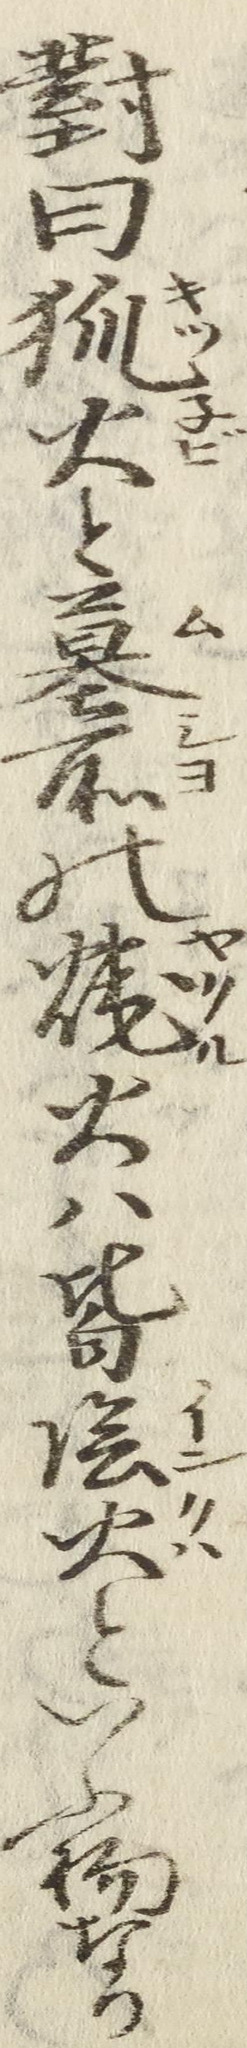対曰狐火と墓所の焼火は皆陰火といふ物なり
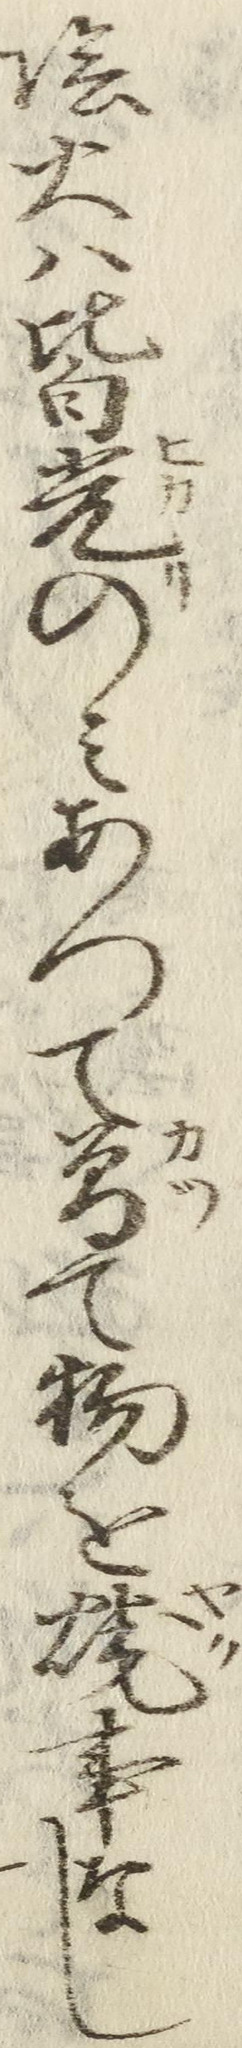陰火は皆光のみあつて曽て物を焼事なし
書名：天地或問珍　地
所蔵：東京大学地震研究所図書室 Earthquake Research Institute Library, The University of Tokyo, JAPAN
